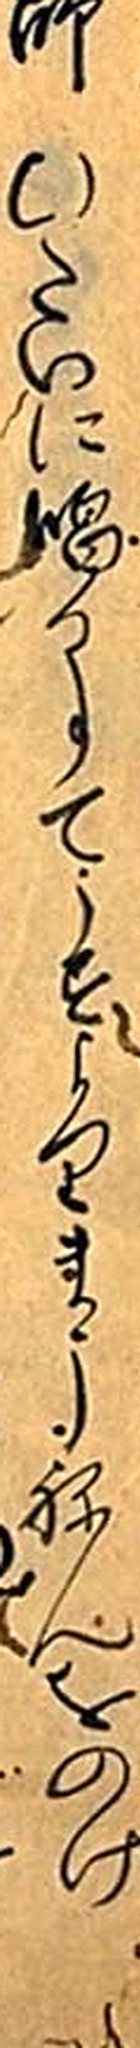師ひたいに唱る事てうすよりまうねんをのけ
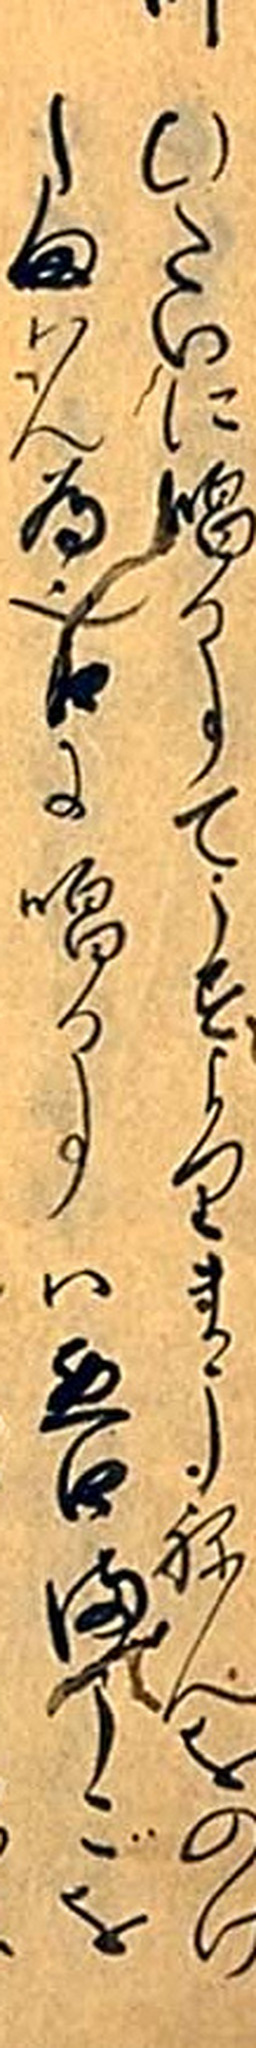たまはん為也口に唱る事は悪口まうごを
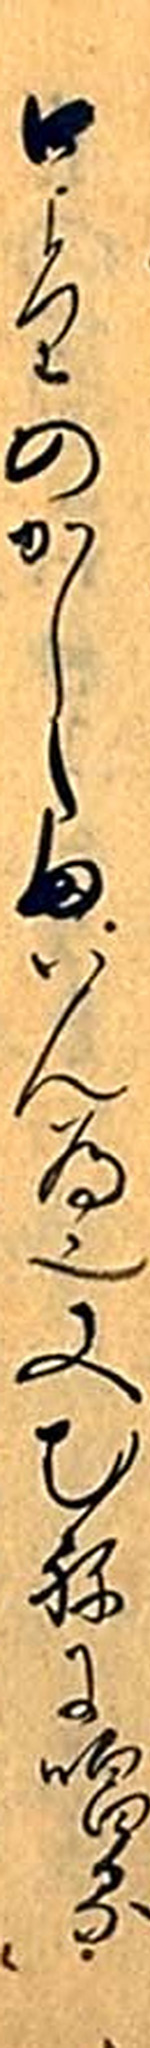口よりのかしたまはん為也又むねに唱る
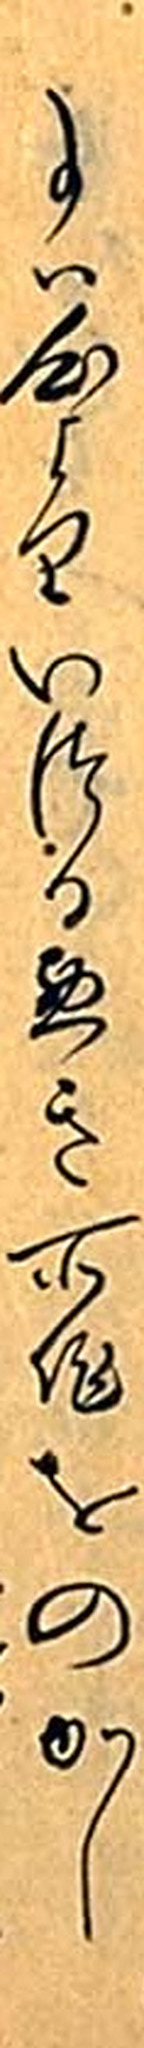事は心よりいつる悪き所作をのかし
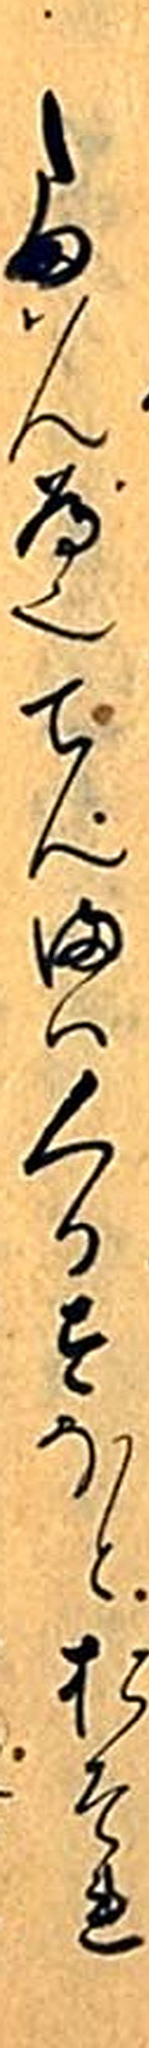たまはん為なりてんまはくるすほとおそれ
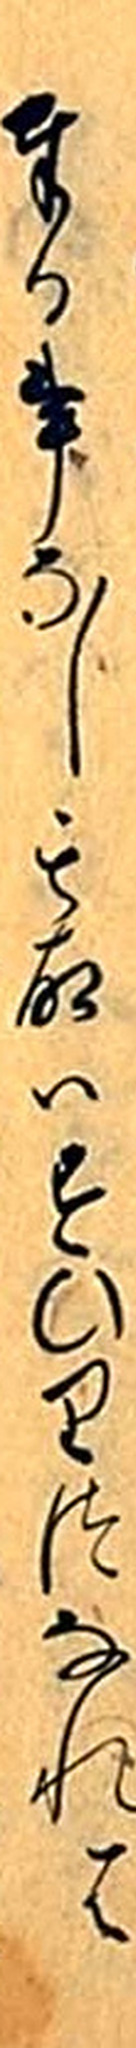奉る事なし其故はすひりつなれは
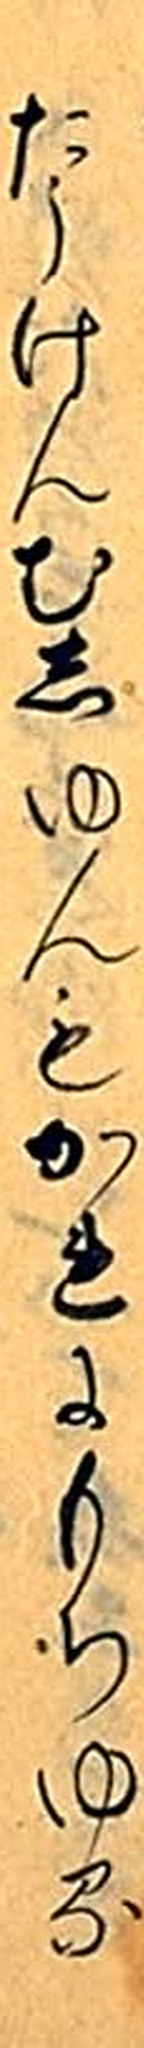たうけんむしゆんもかれにもちゆる
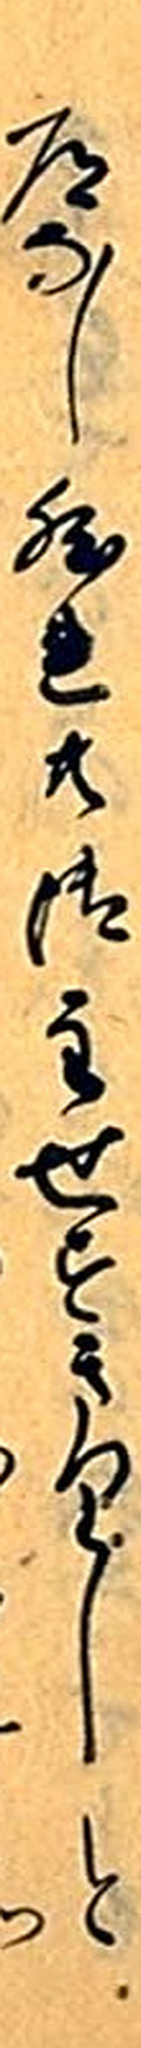道なし然れ共御主せすきりしと
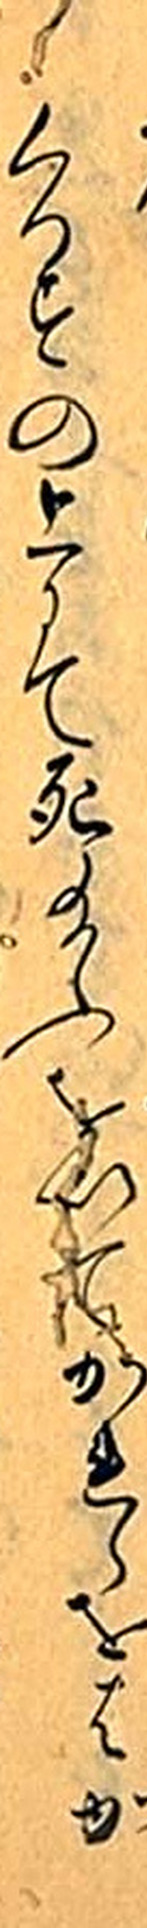くるすの上にて死給ふを以てかれらをはか
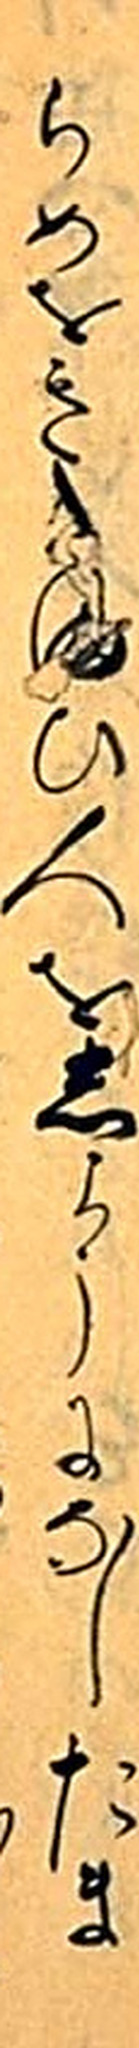らめをきたまひ人をしようになしたま
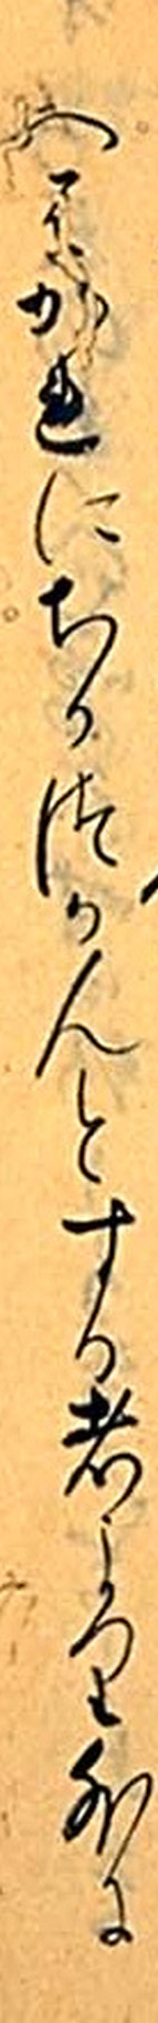へかれにちかつかんとする者より外に
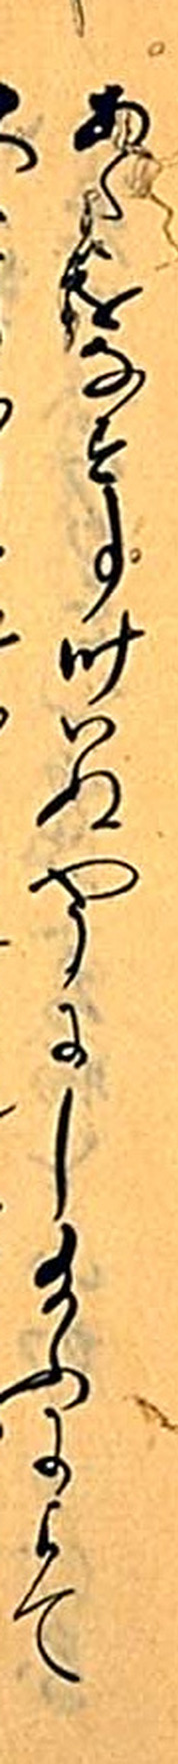あたをなす事叶はぬやうにし給ふによて
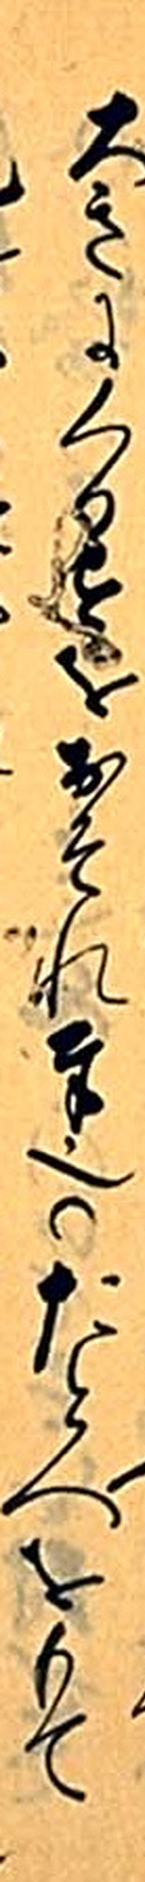大きにくるすをおそれ奉也○たとへをもて
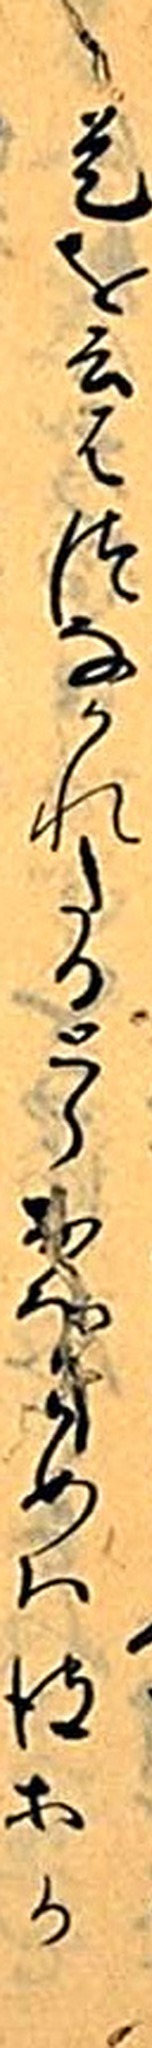是を云はつなかれたるとらおほかめは彼等か
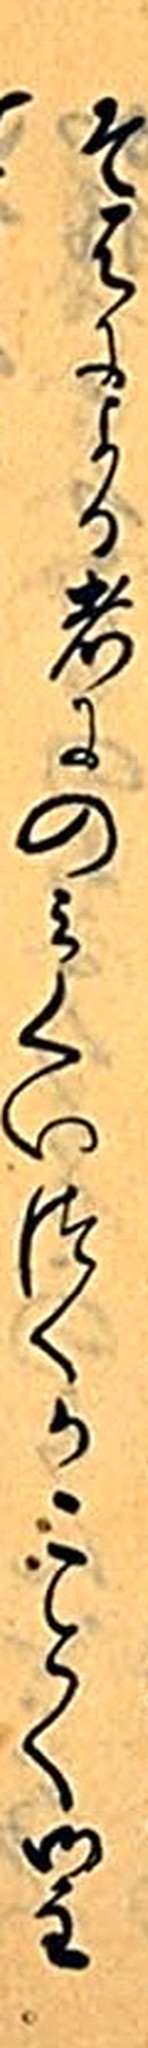そはによる者にのみくいつくかことく御主
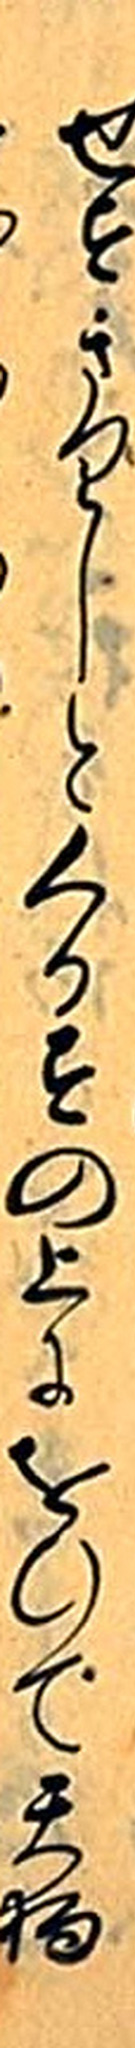せすきりしとくるすの上にをひて天狗
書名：ドチリナ・キリシタン
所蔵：東京大学総合図書館 / General Library in the University of Tokyo
